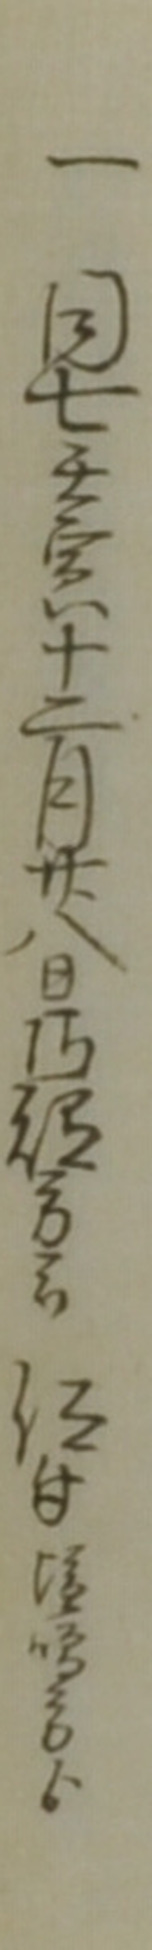一同七壬寅十二月廿八日御賄方被仰付塩噌方ゟ
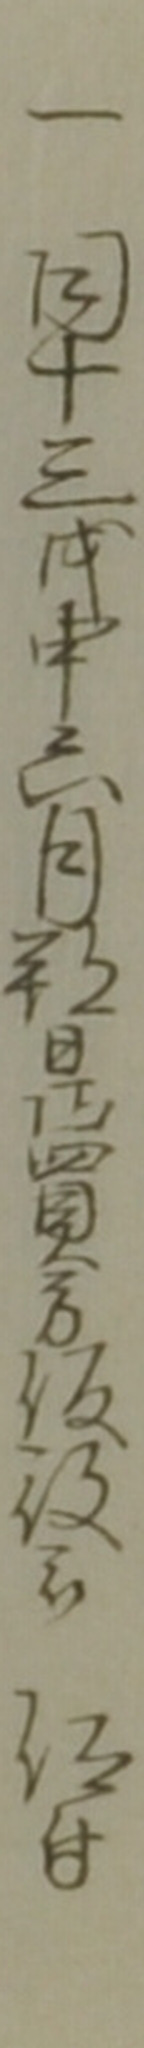一同十三戊申六月朔日御買方仮役被仰付
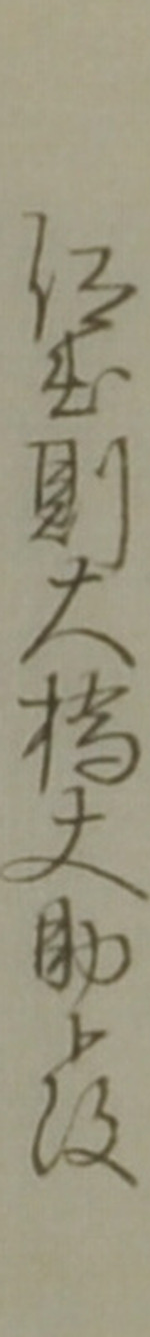仰出則大橋丈助ト改
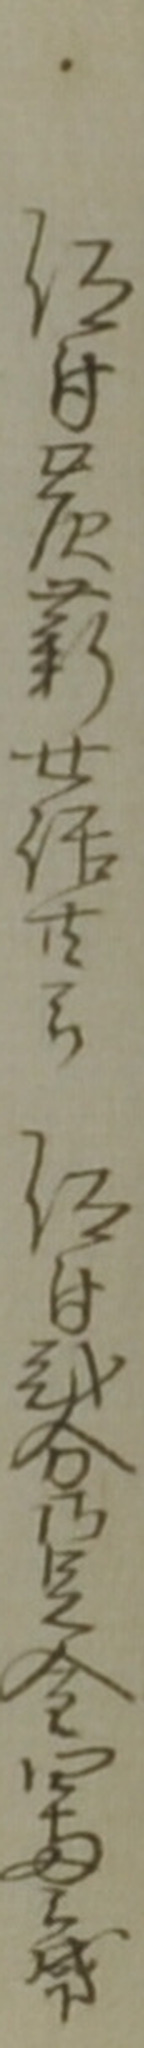仰付炭薪世話共被仰付弐分御足金四両被成下
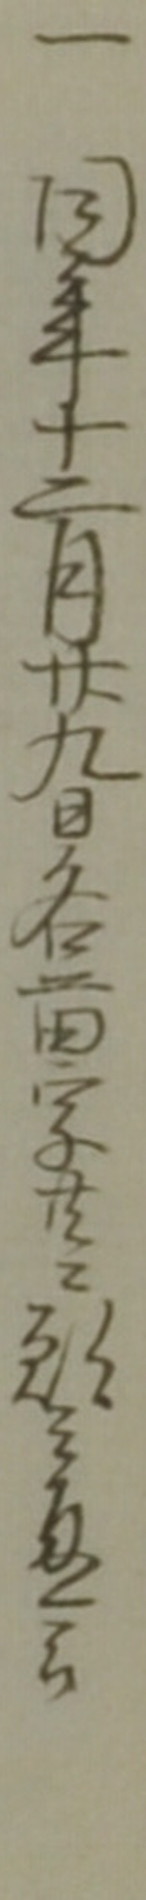一同年十二月廿九日名苗字共願之通被
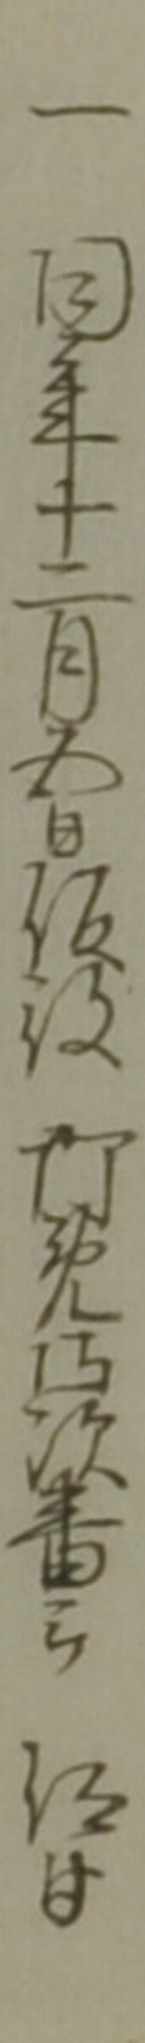一同年十二月五日仮役御免御次番被仰付

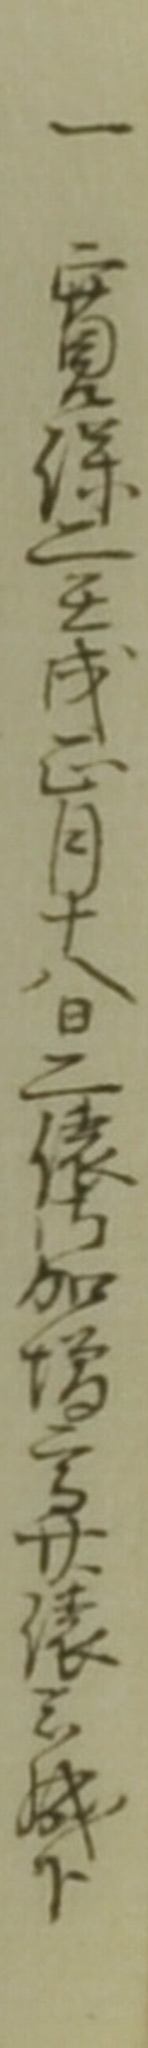一寛保二壬戌正月十八日二俵御加増高廿俵被成下
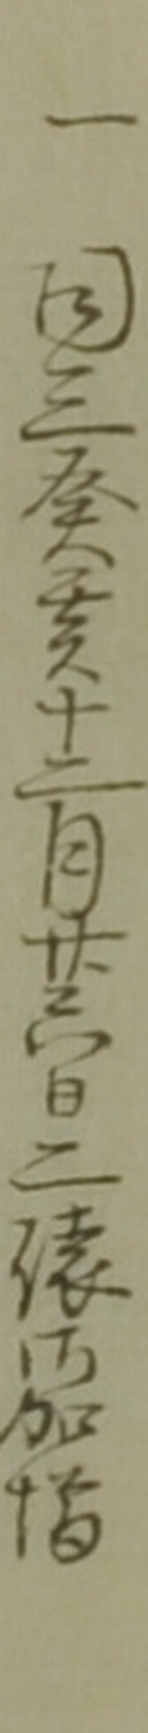一同三癸亥十二月廿六日二俵御加増
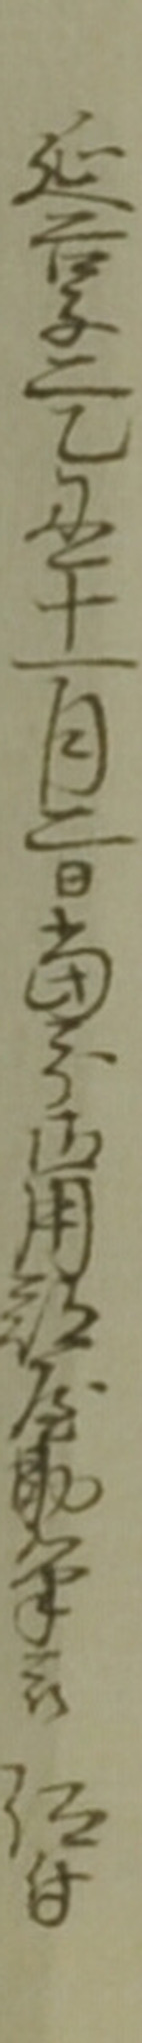一延享二乙丑十一月二日当分御用部屋助筆被仰付
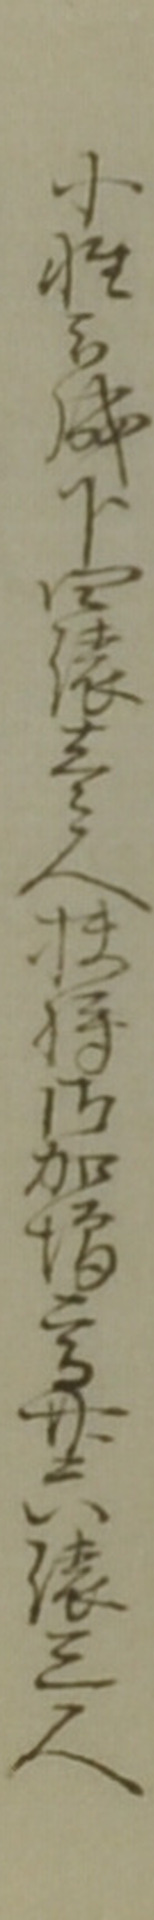小性被成下四俵壱人扶持御加増高廿六俵三人
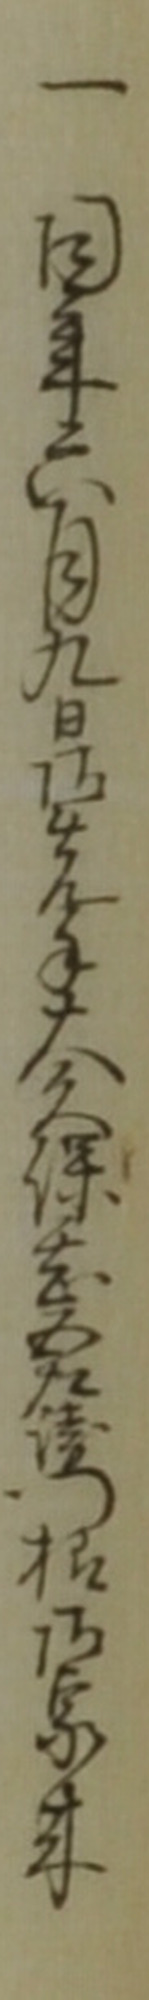一同年六月九日御先手大久保甚五左衛門様御家来
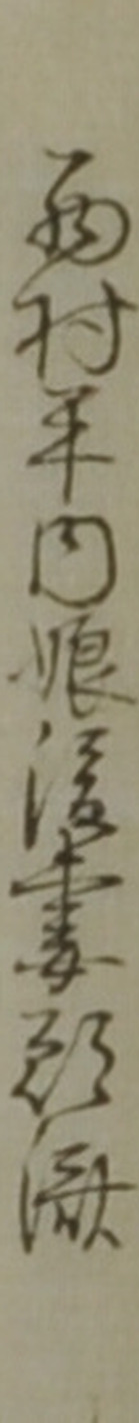西村平内娘後妻願済
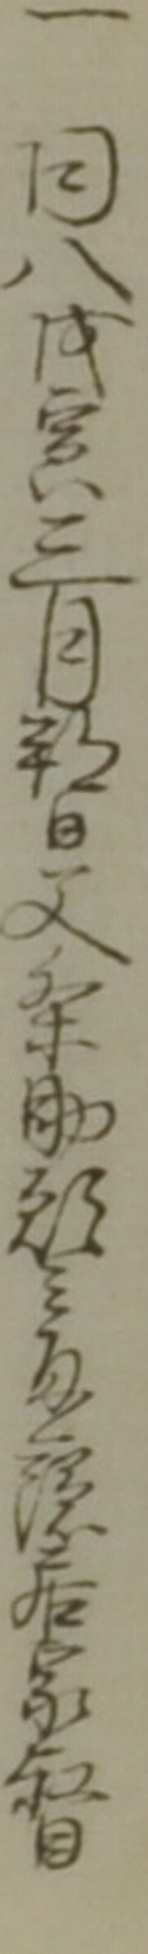一同八戊寅三月朔日父条助願之通隠居家督
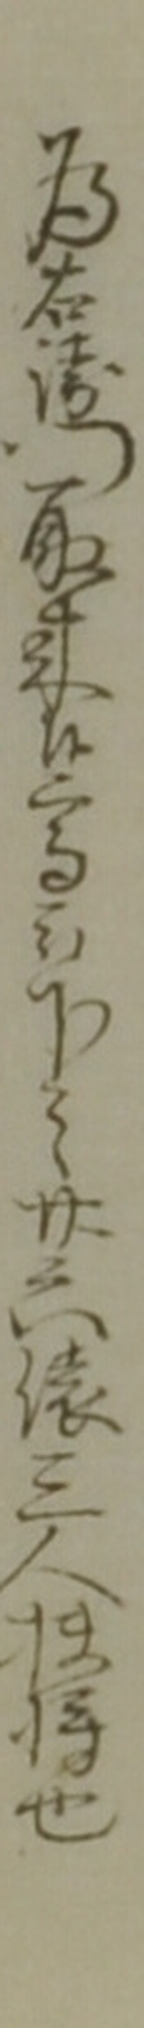為右衛門取来候高被下之廿六俵三人扶持也

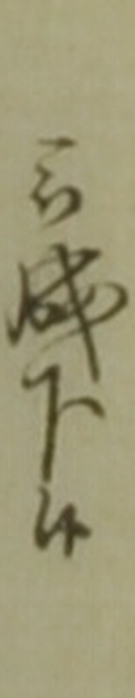被成下候
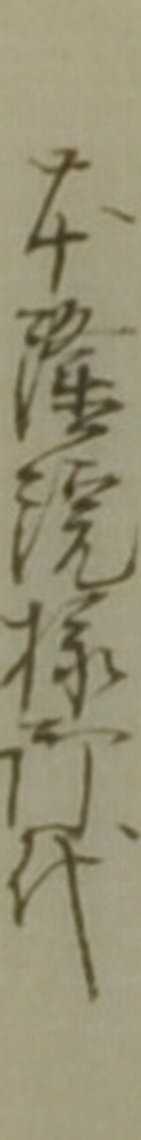本隆院様御代
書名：無足廃家（弐）
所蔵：伊那市立高遠町図書館・合同会社AMANE
